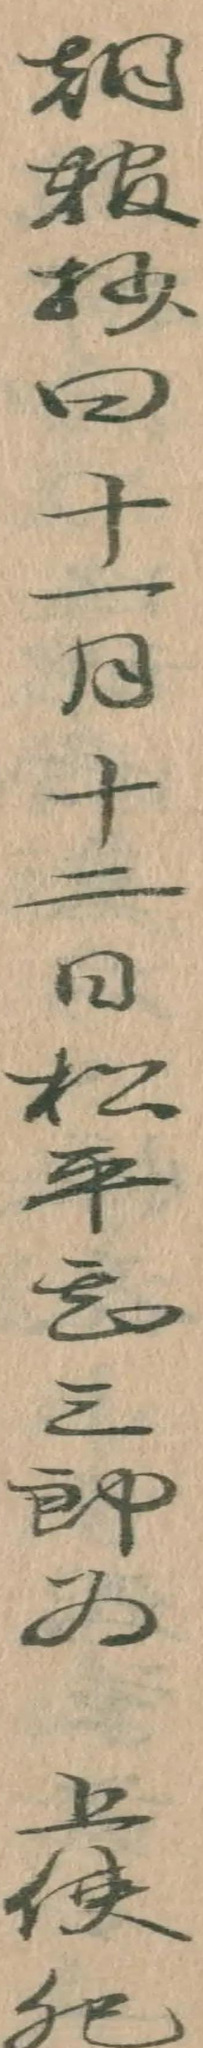朝報抄曰十一月十二日松平甚三郎ゐ上使肥
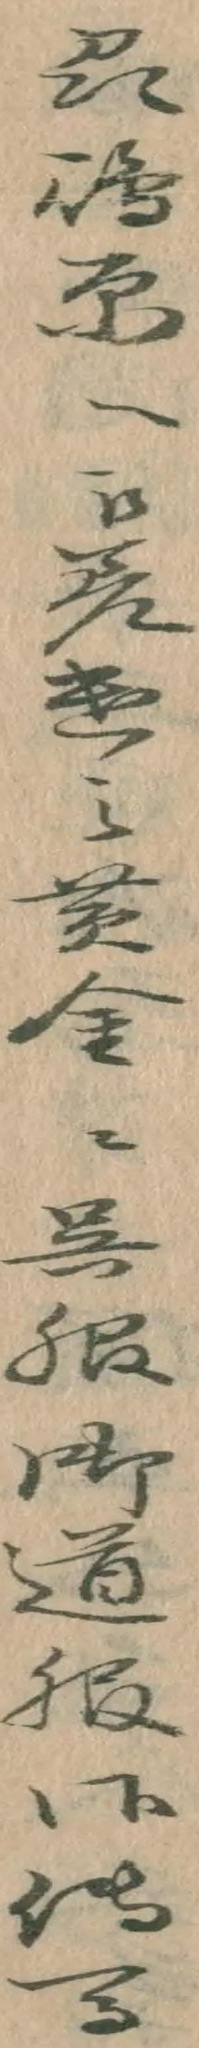州島原へ被差遣し黄金に呉服御道服御伝馬
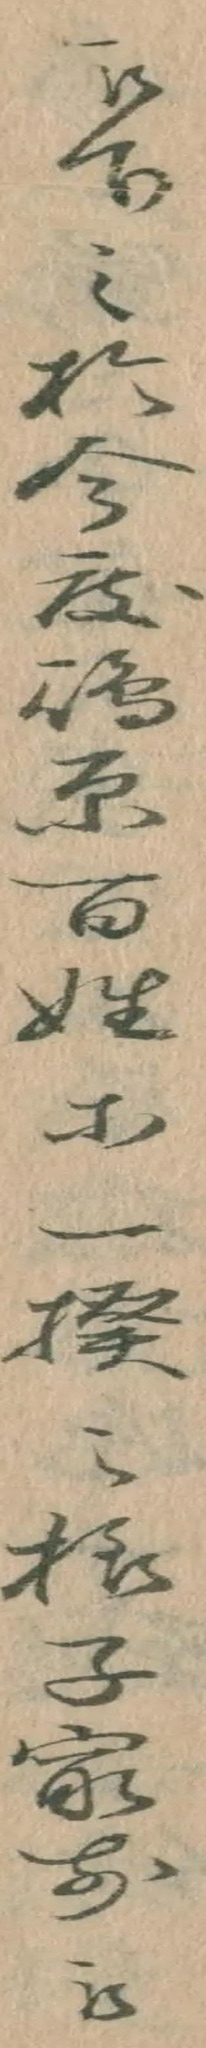被下之於今度島原百姓等一揆之様子最前被
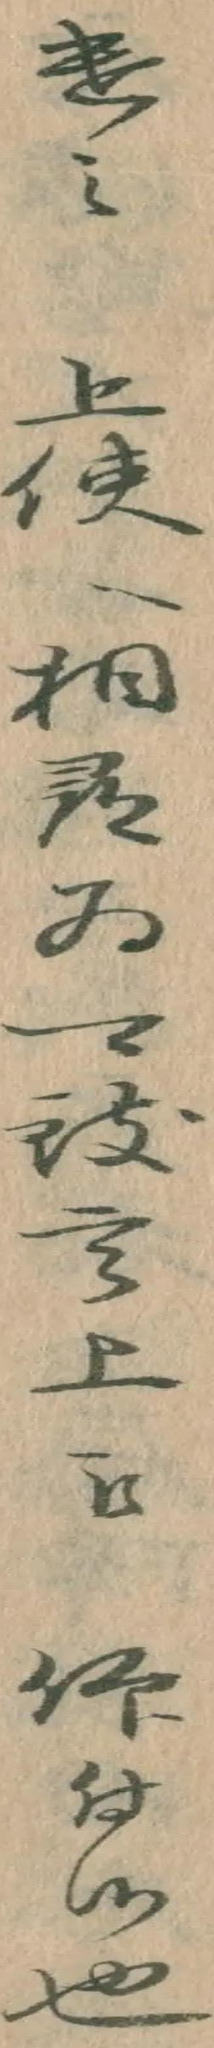遣之上使へ相尋ゐ可致言上被仰付候也
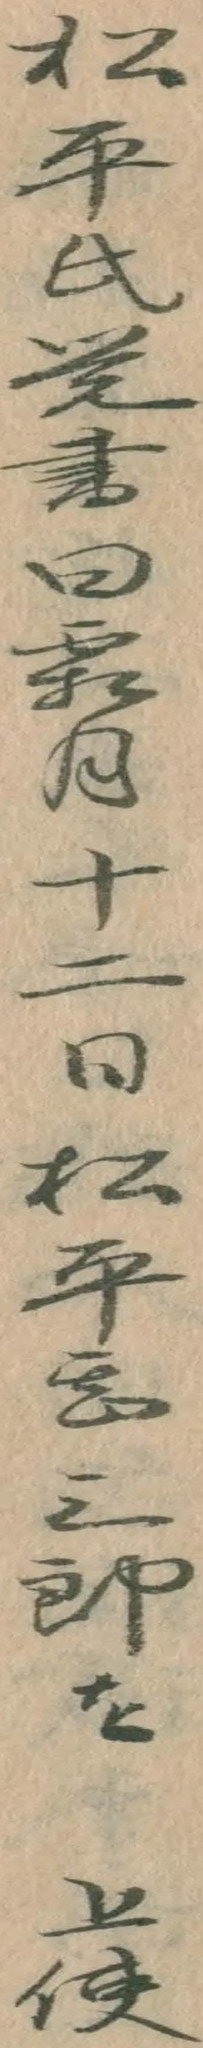松平氏覚書曰霜月十二日松平甚三郎を上使
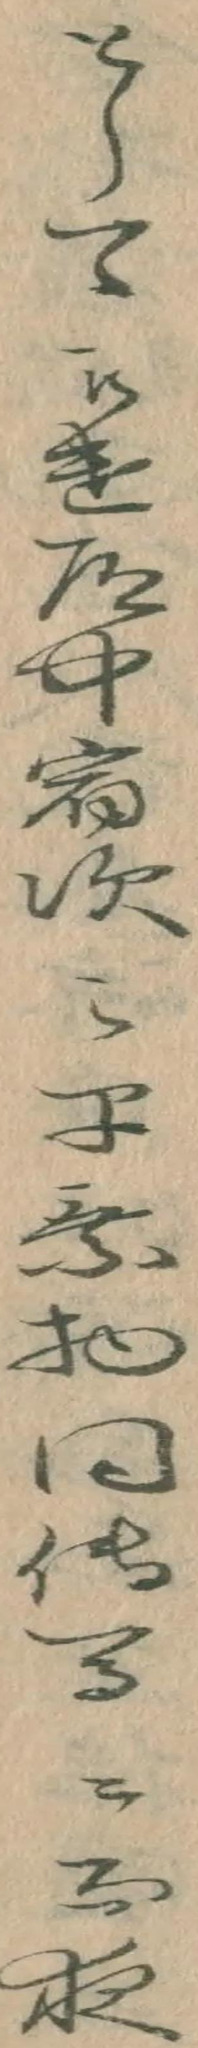として被遣道中宿次之早乗物同伝馬に而夜
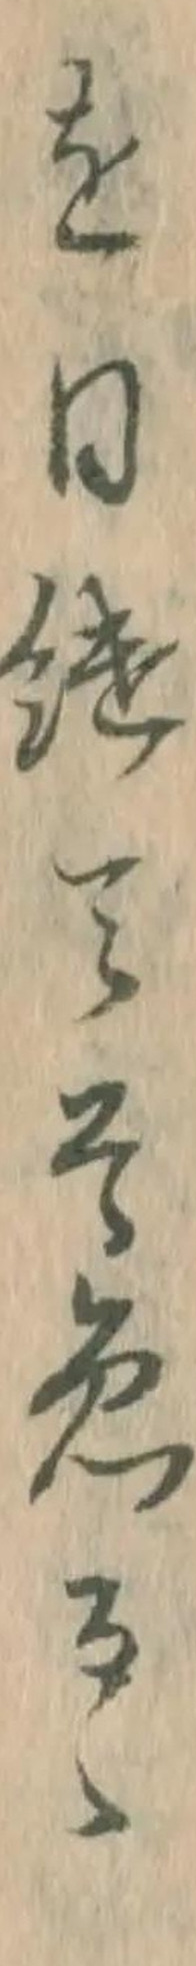を日鑓てそ免るゝ

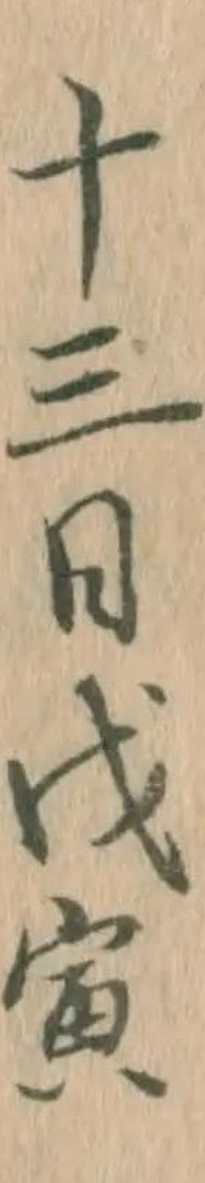十三日戌寅
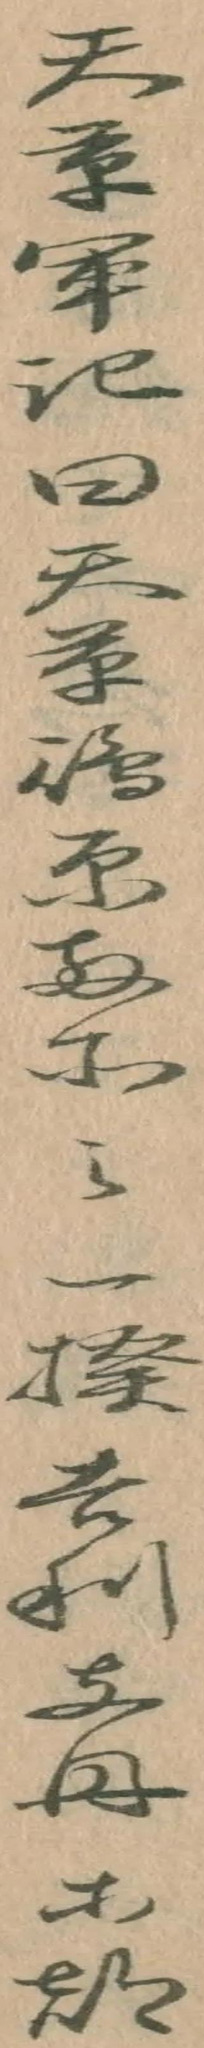天草軍記曰天草島原両所之一揆吉利支丹等都
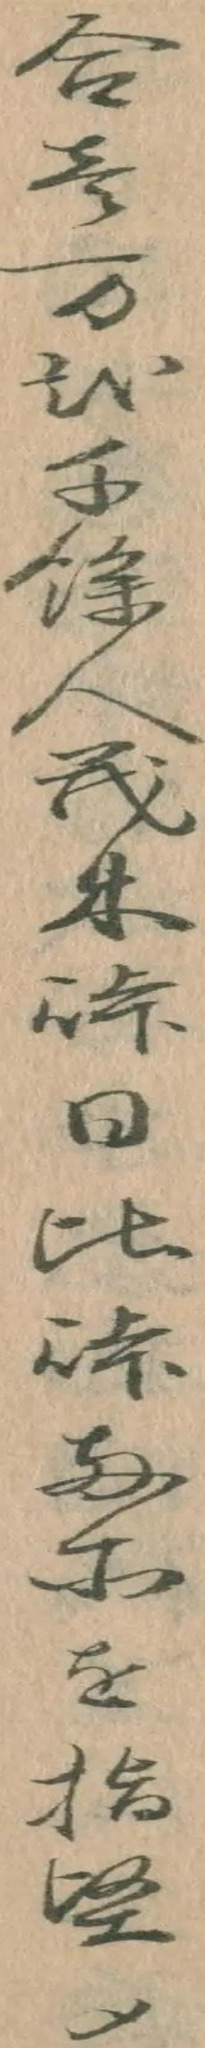合壱万弐千余人茂木峠日比峠両所を指堅め
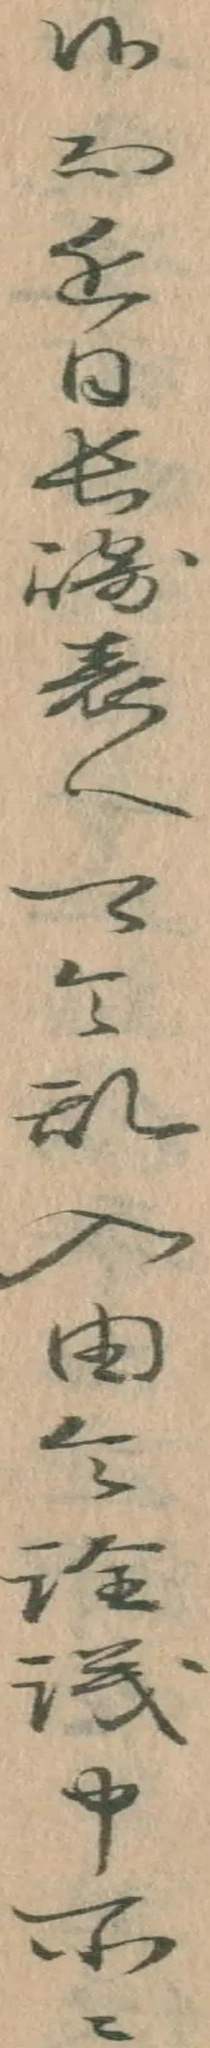候而近日長崎表へ可令乱入由令詮議申所に
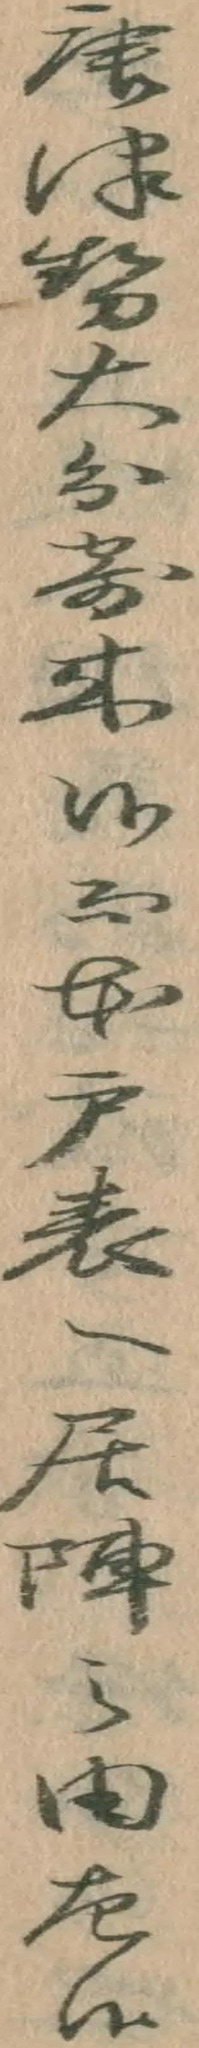唐津勢大分寄来候而本戸表へ居陣之由左候
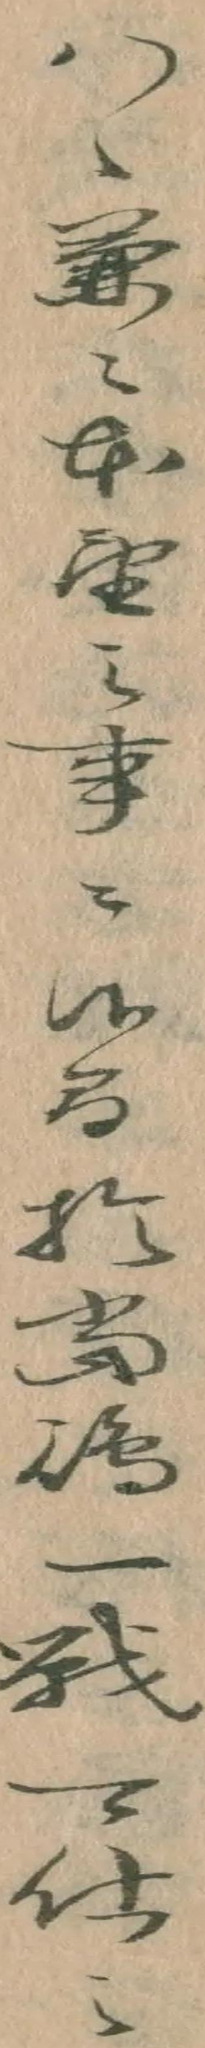はゝ兼々本届之事に候間於当島一戦可仕之
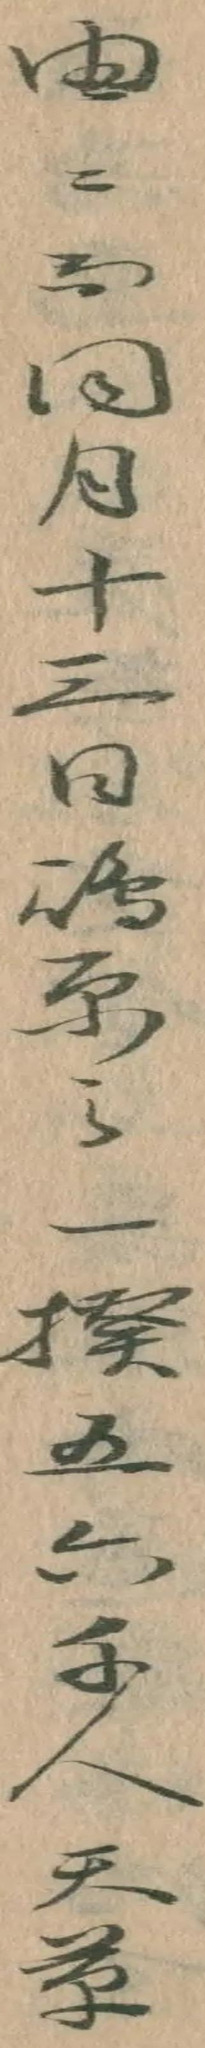由に而同月十三日島原之一揆五六千人天草
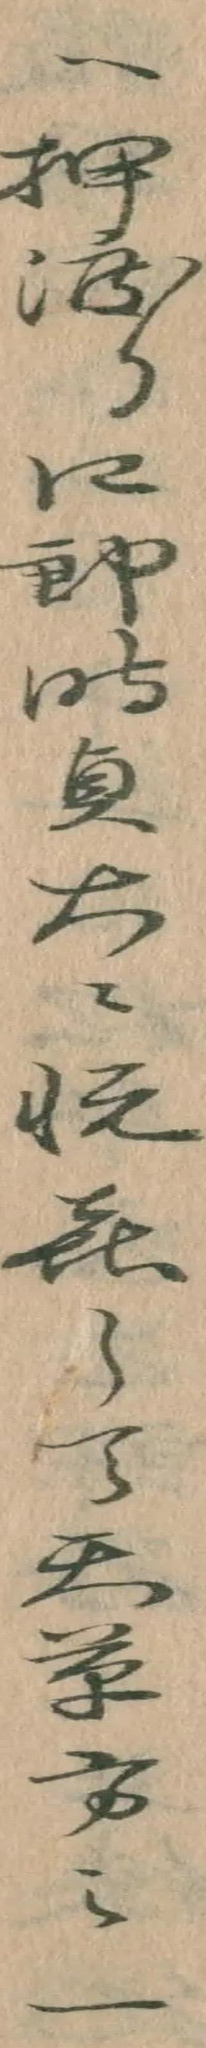へ押渡り四郎時貞大に悦喜して天草方之一
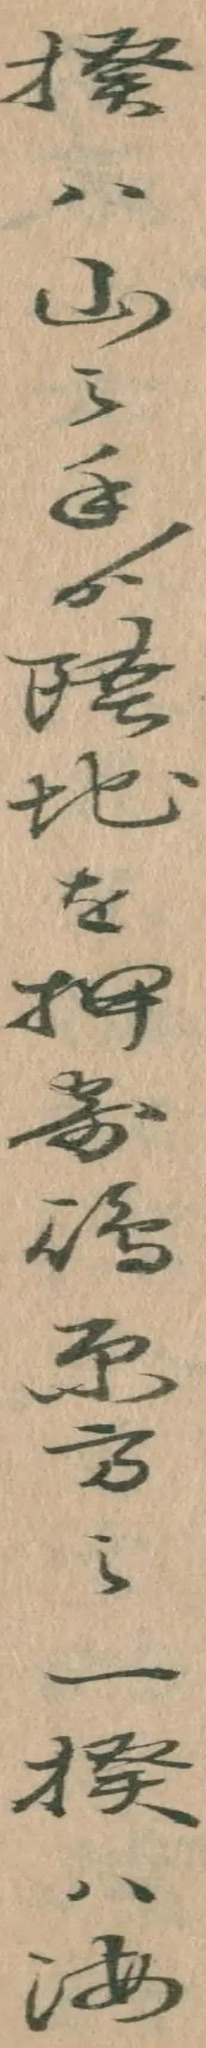揆は山之手ゟ陸地を押寄島原方之一揆は海
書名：切支丹御退治記 49巻. [2]
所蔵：国立国会図書館 National Diet Library, JAPAN
